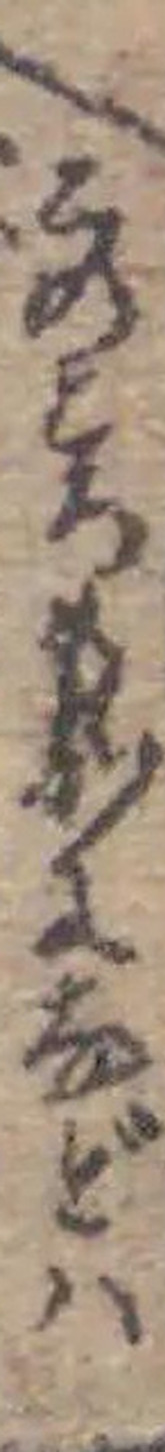このころもかになどは
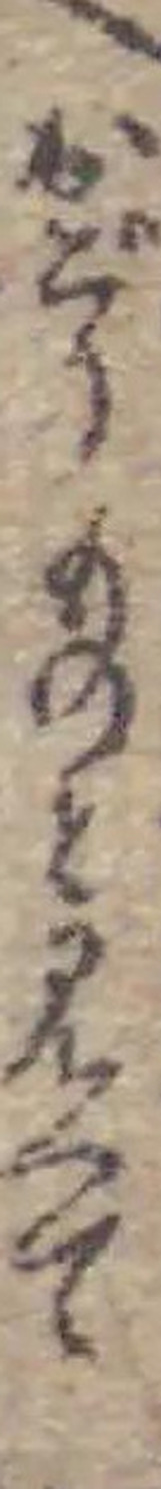おごりものと見へて
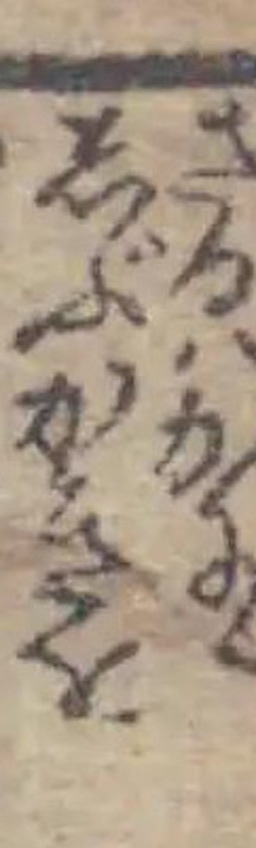しぶかきを
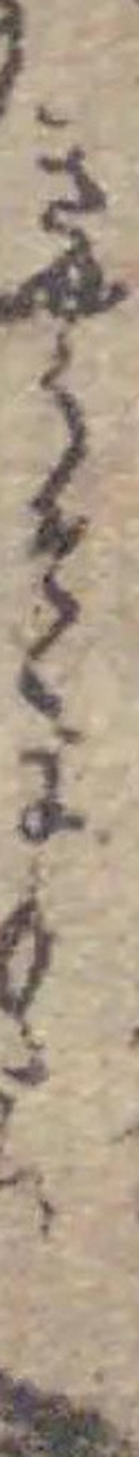きやうそくにもたれ
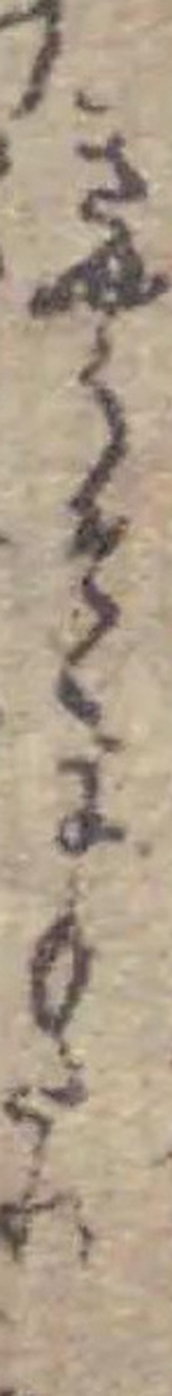きやうそくにもたれ
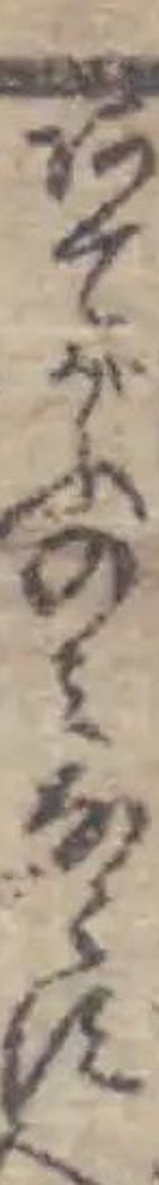あてがふのみならす
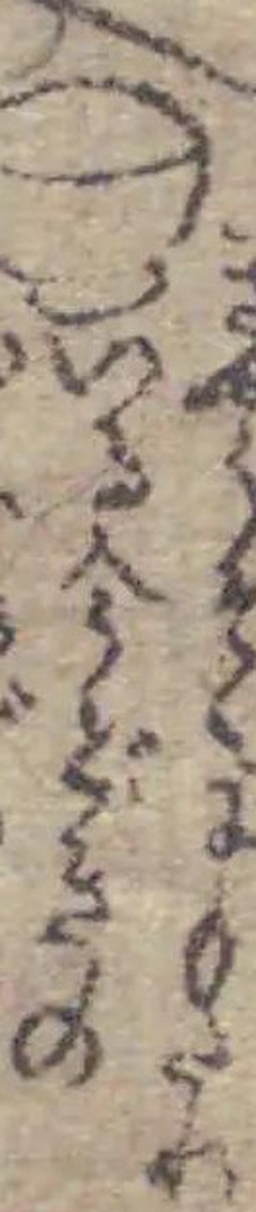いる今どきの
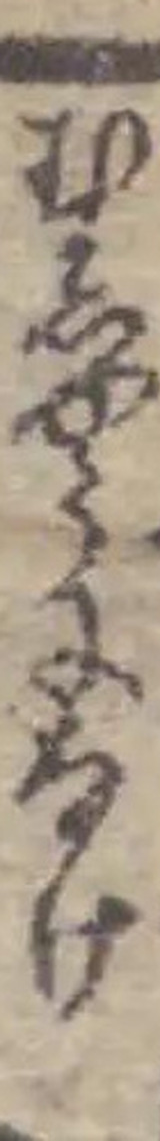むしやうになげ
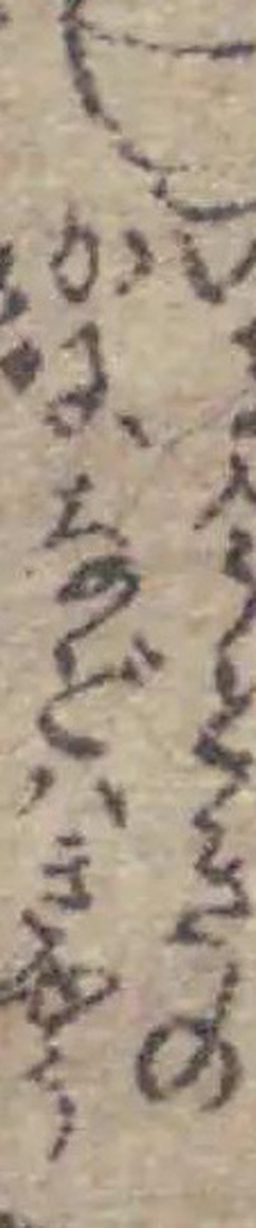かになどはきやう
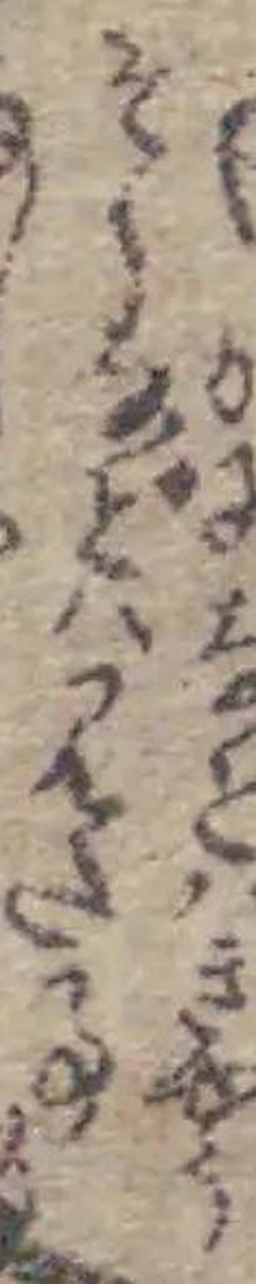そくなどは見た事も
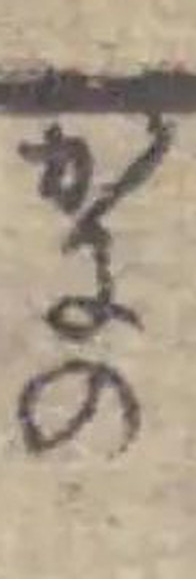かにの
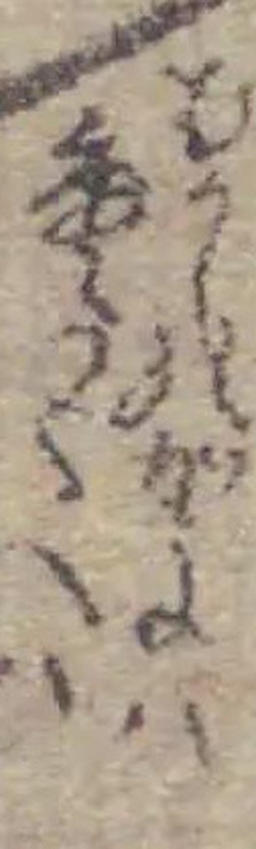つくへは
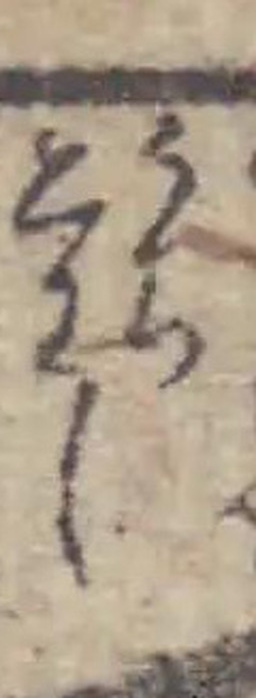こわし
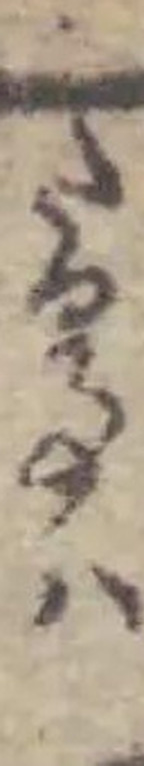たる事は
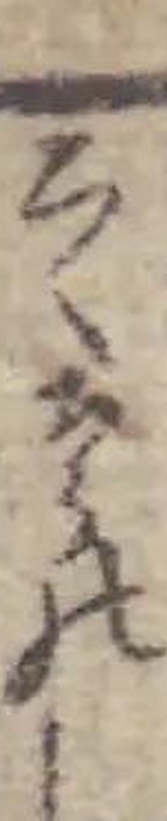こくちうの
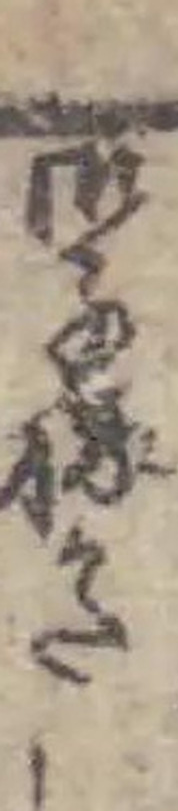御子様かた
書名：蟹牛房挟多 3巻
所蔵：国立国会図書館 National Diet Library, JAPAN
